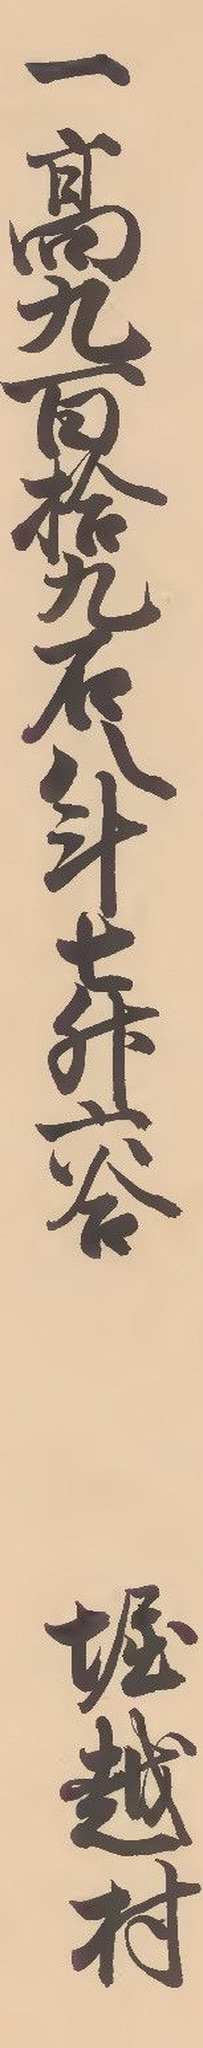一高九百拾九石八斗七升六合堀越村

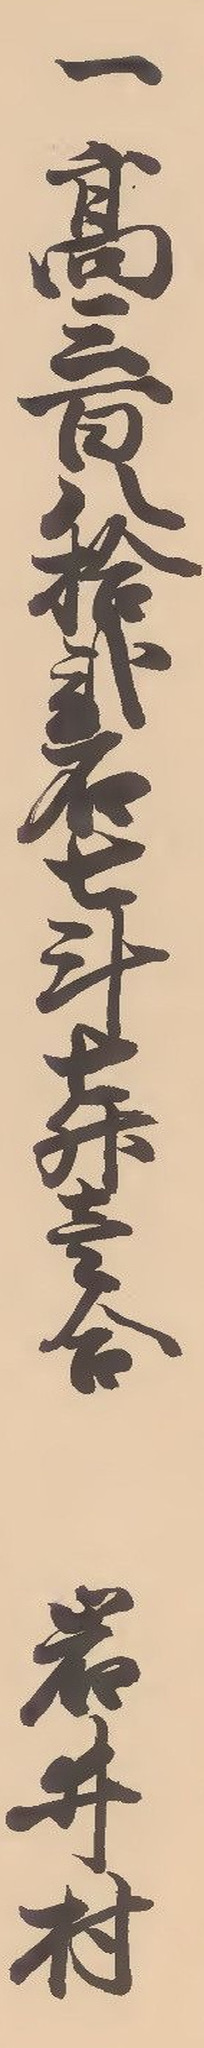一高三百八拾弐石七斗七升壱合岩井村
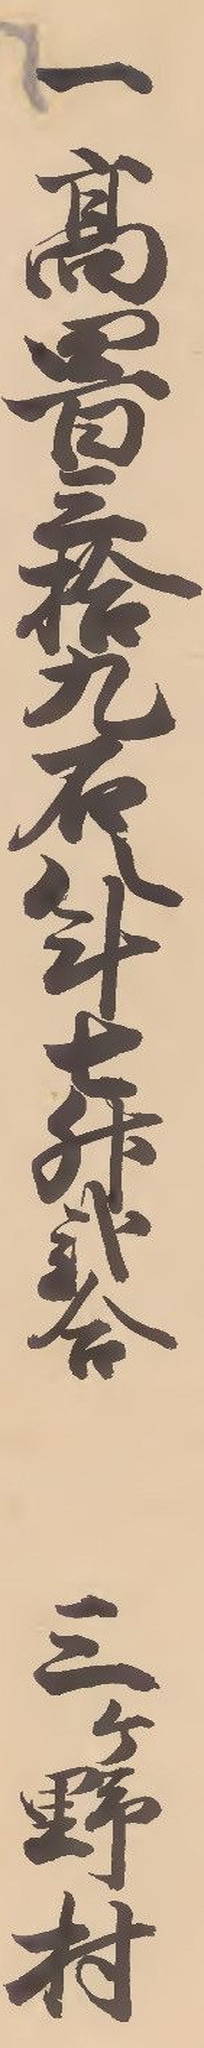一高四百三拾九石八斗七升弐合三ヶ野村
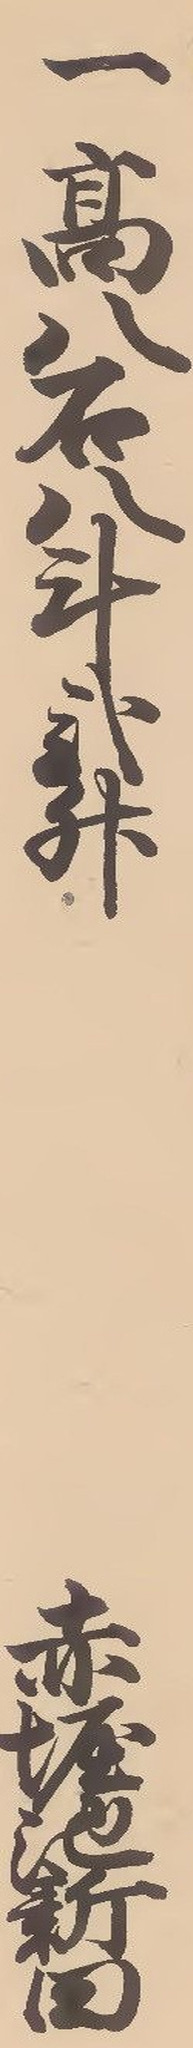一高八石八斗弐升赤堀池新田
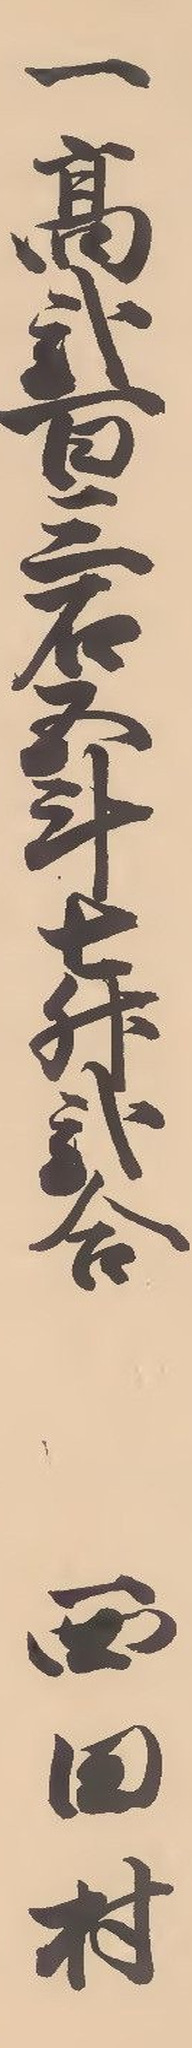一高弐百三石五斗七升弐合西田村
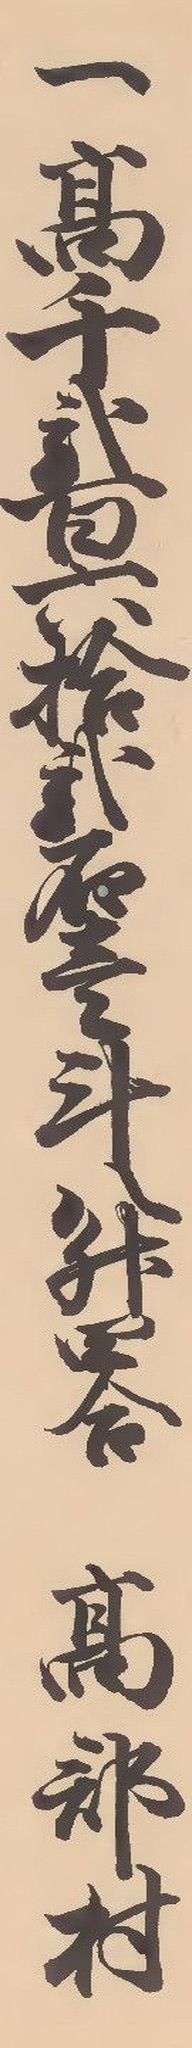一高千弐百六拾弐石壱斗八升四合高部村
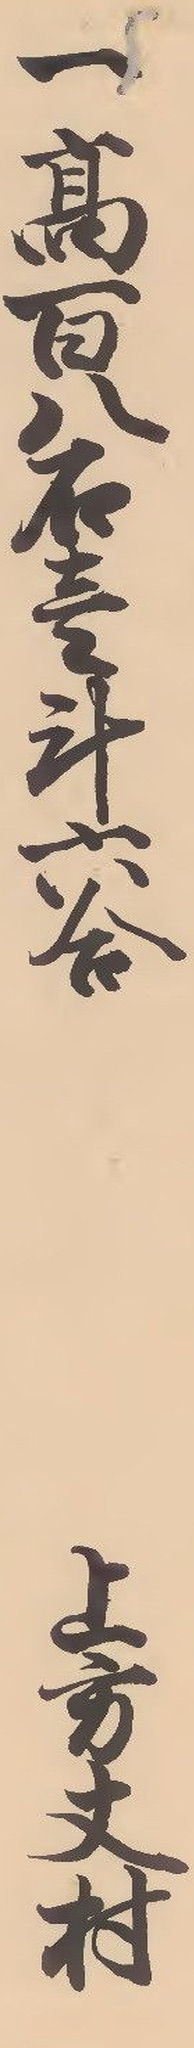一高百八石壱斗六合上方丈村
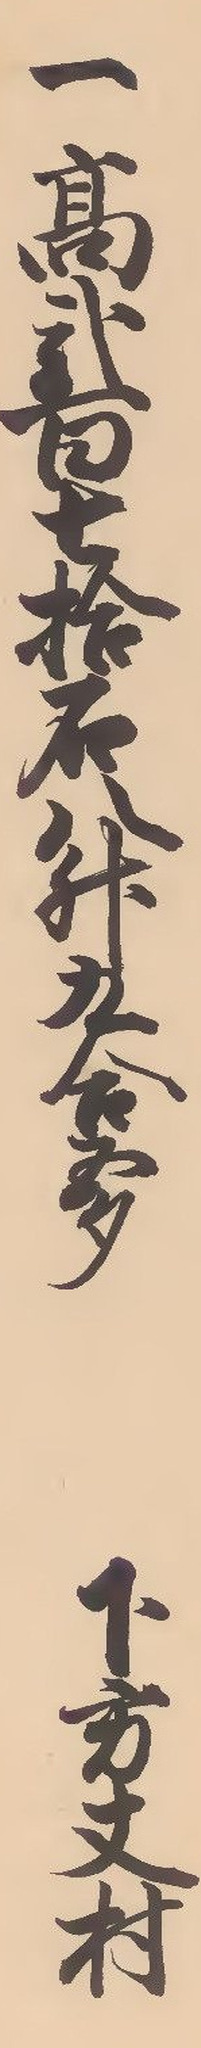一高弐百七拾石八升九合五勺下方丈村

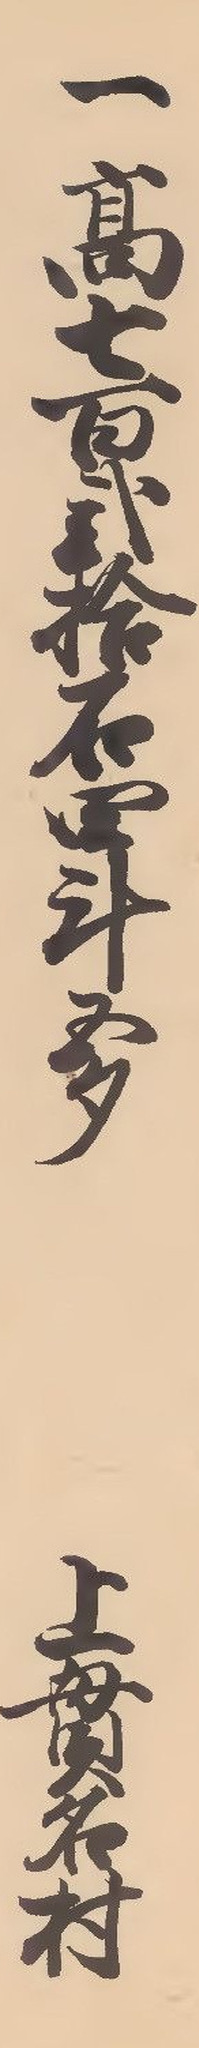一高七百弐拾石四斗五勺上貫名村
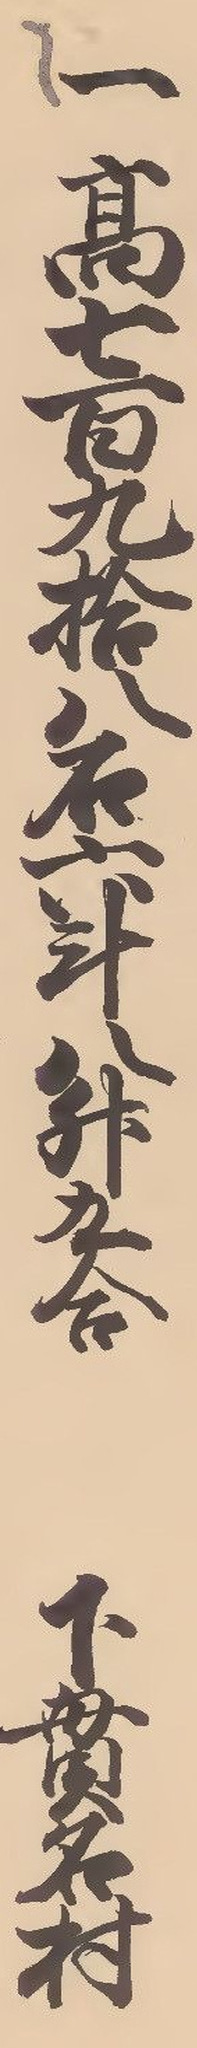一高七百九拾八石六斗八升九合下貫名村
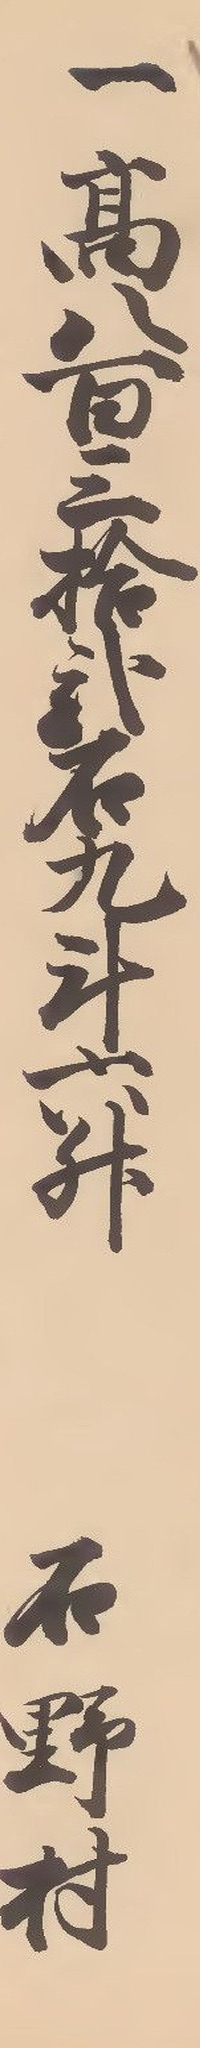一高八百三拾弐石九斗六升石野村
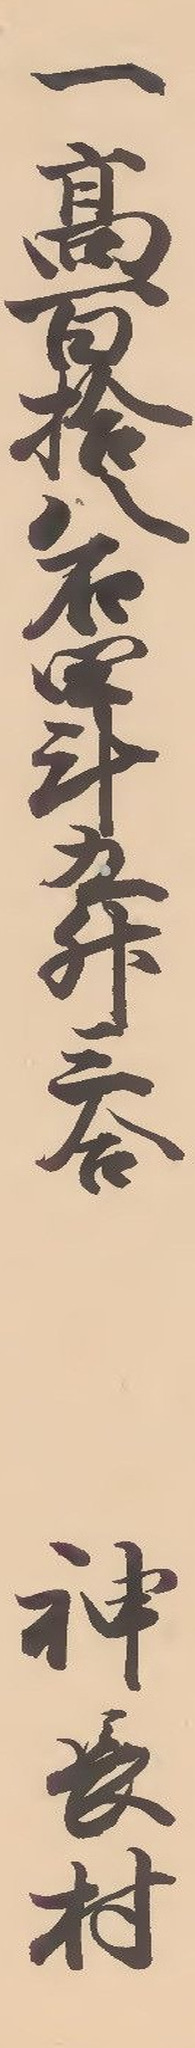一高百拾八石四斗九升三合神長村
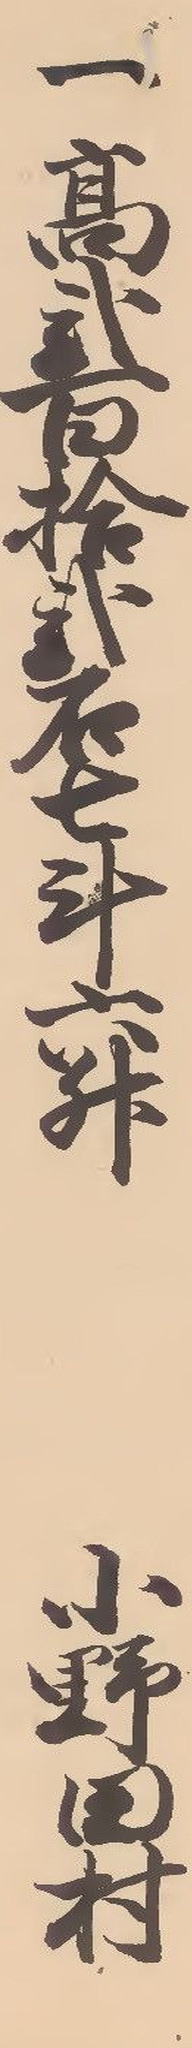一高弐百拾弐石七斗六升小野田村

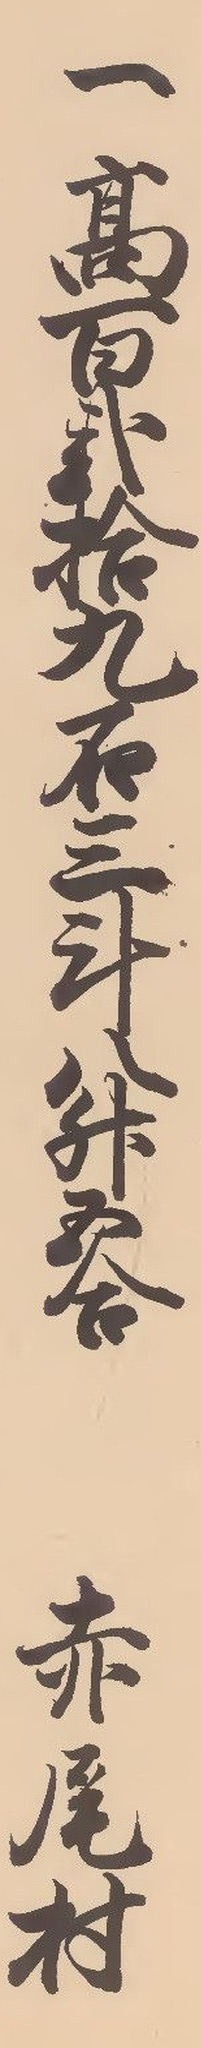一高百弐拾九石三斗八升五合赤尾村
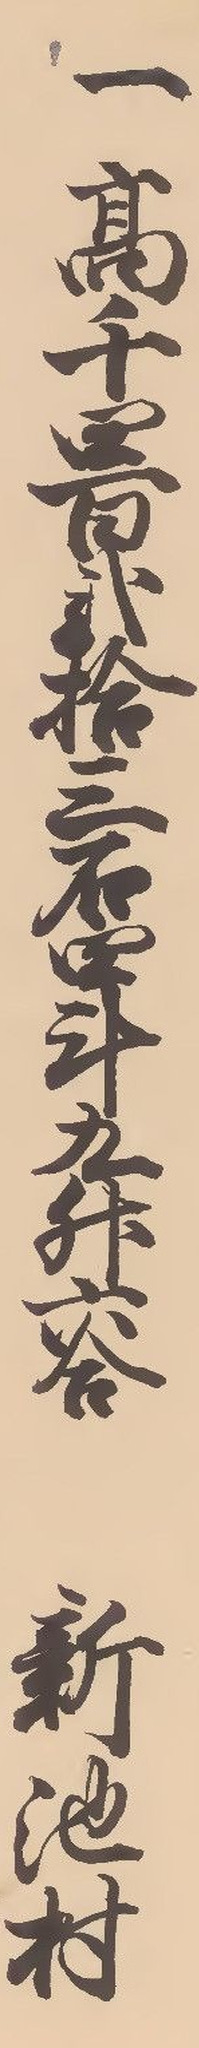一高千四百弐拾三石四斗九升六合新池村
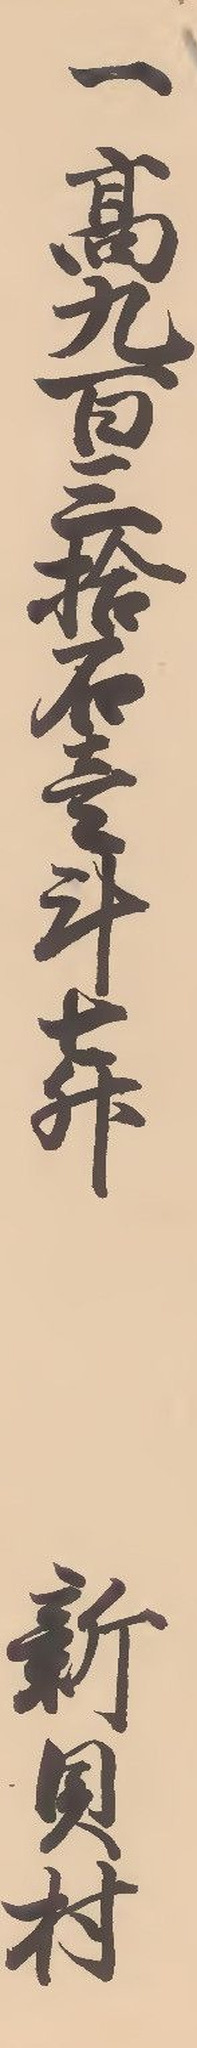一高九百三拾石壱斗七升新貝村
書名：遠江国郷帳
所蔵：国立公文書館 National Archives of Japan
